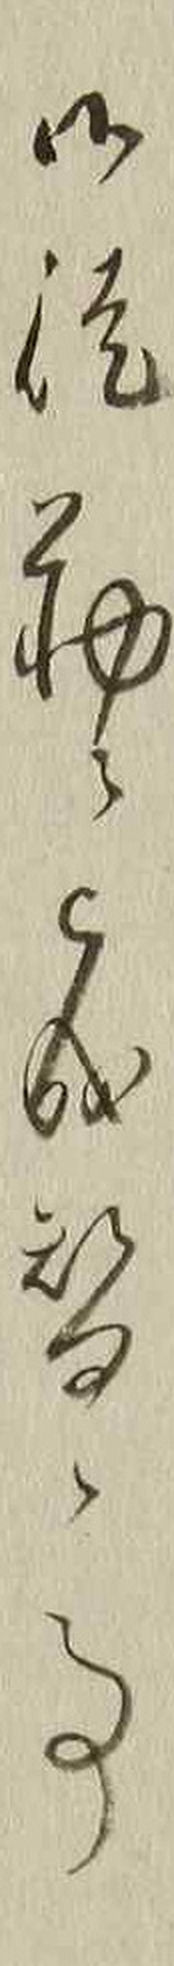御徒勤ニ被成替候事
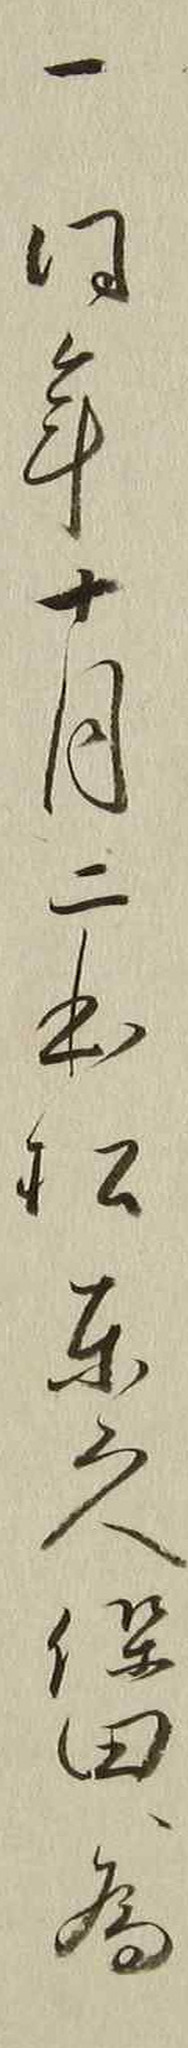一同年十月二本松東久保田へ為
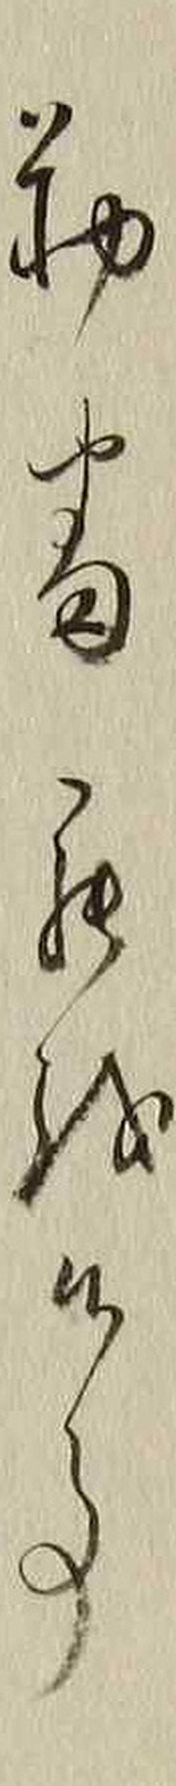勤番罷越候事
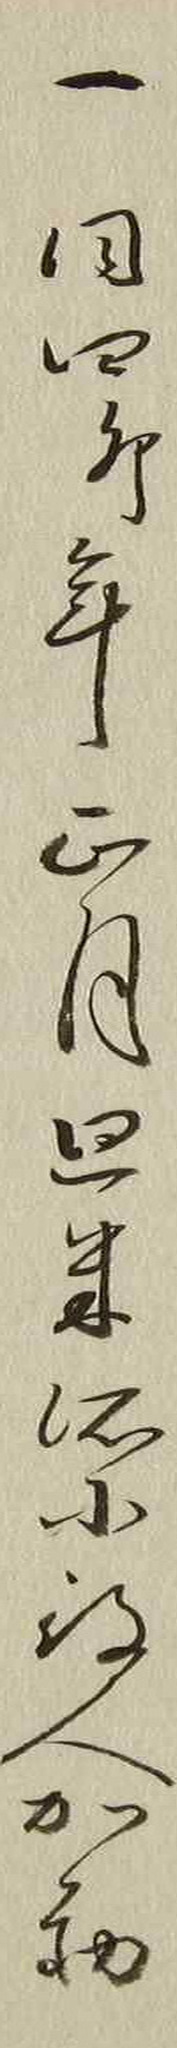一同四卯年正月廻米所小役人加勤
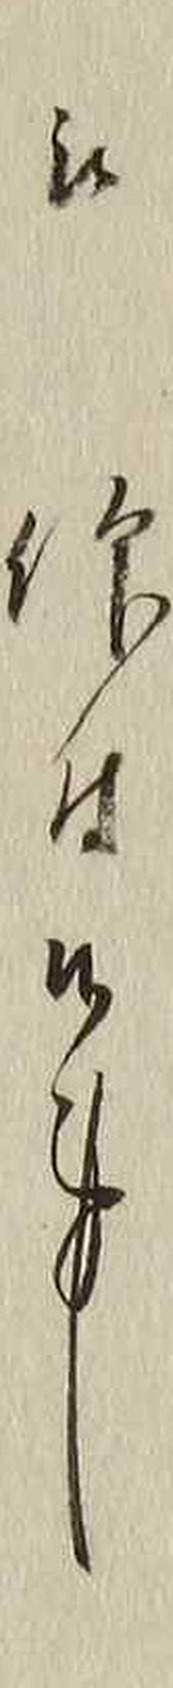被仰付候事
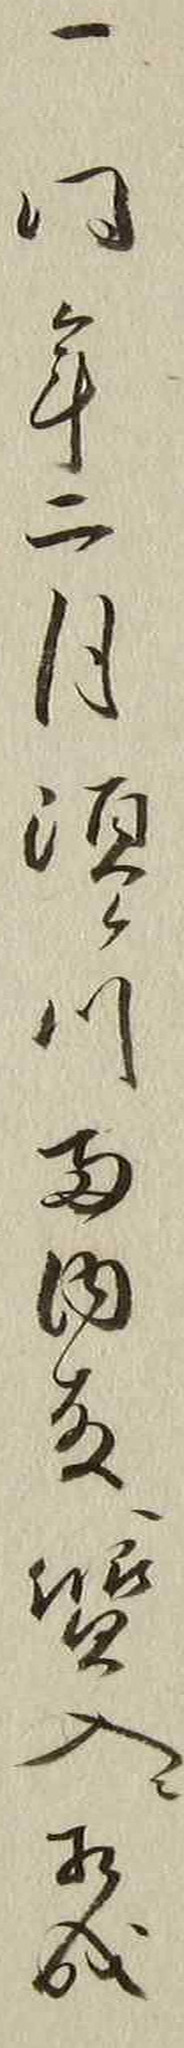一同年二月須ケ川両内殿へ質入ニ相成
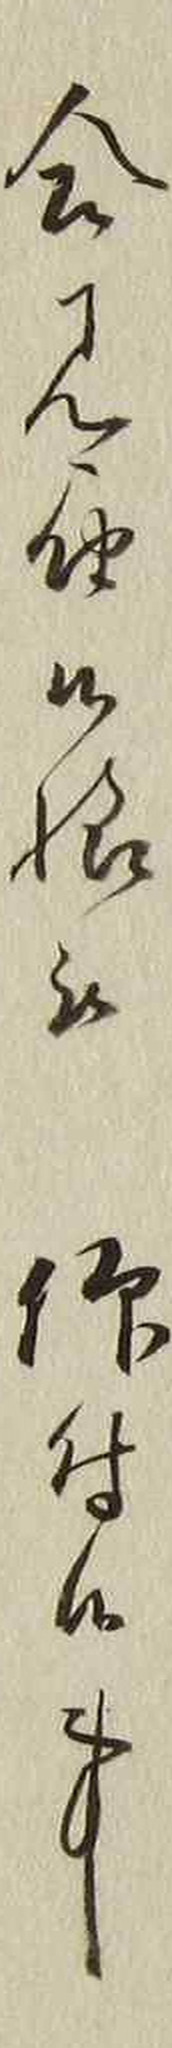合見届候様被仰付候事
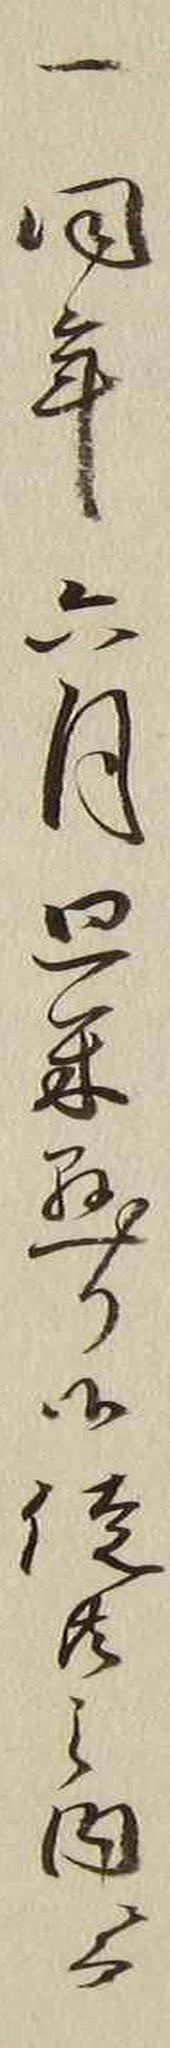一同年六月廻米懸り御徒共之内ニ而
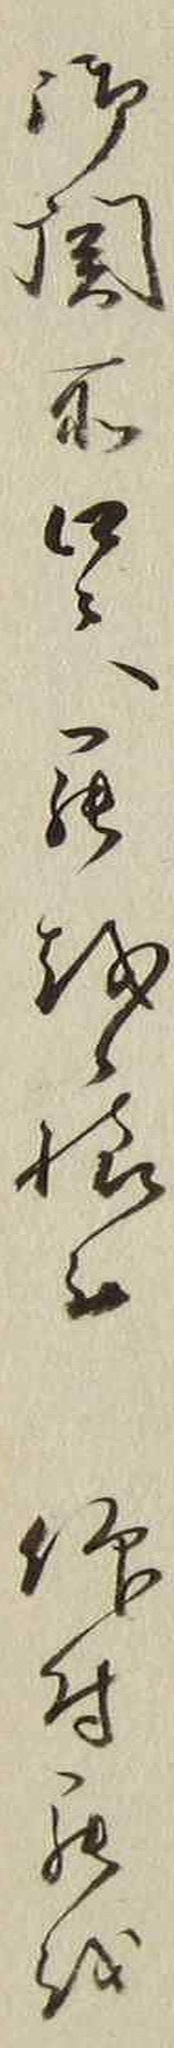御関所口々へ罷越候様被仰付罷越
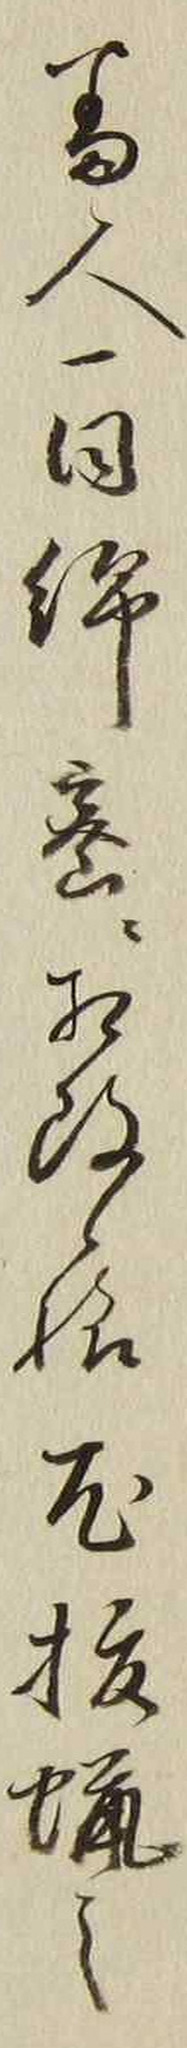番人一同綿密ニ相改候様尤抜蝋之
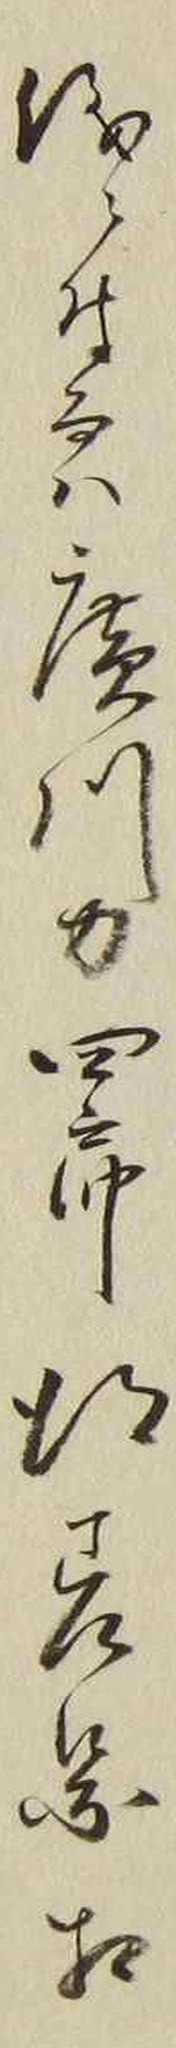儀ニ付而ハ広川力四郎得差図相

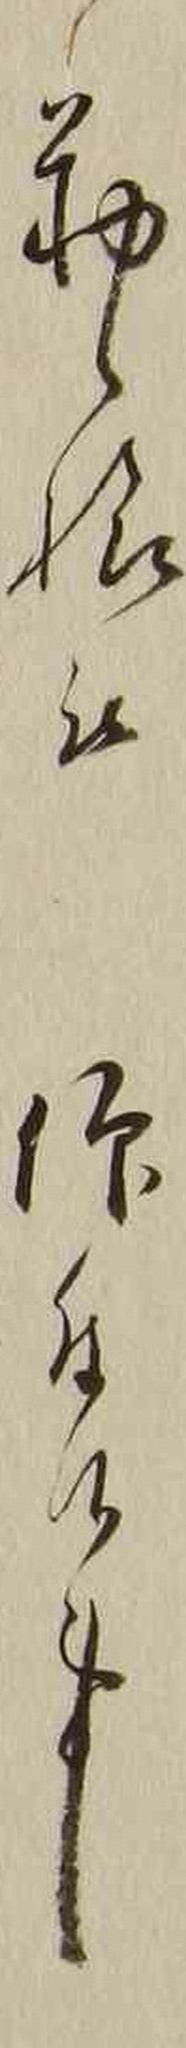勤候様被仰付候事
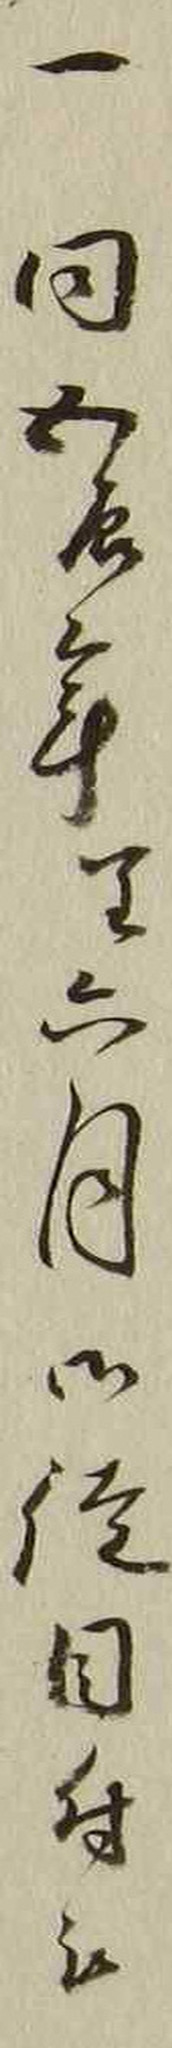一同五辰年閏六月御徒目付被
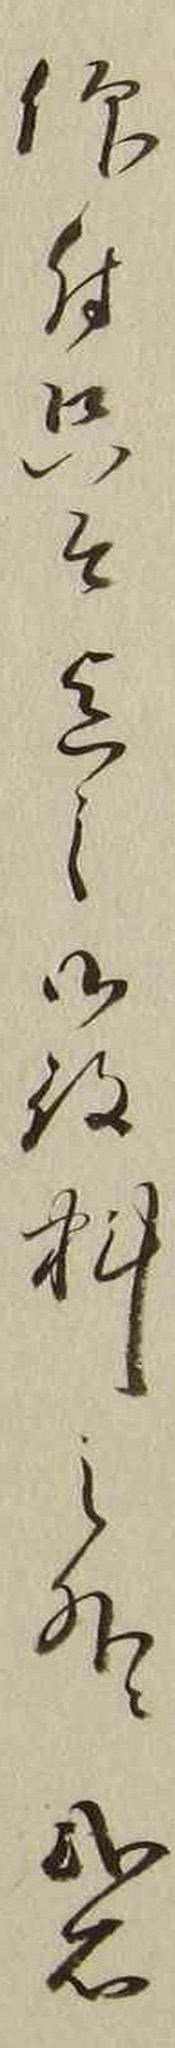仰付只今迄之御役料之外ニ弐石
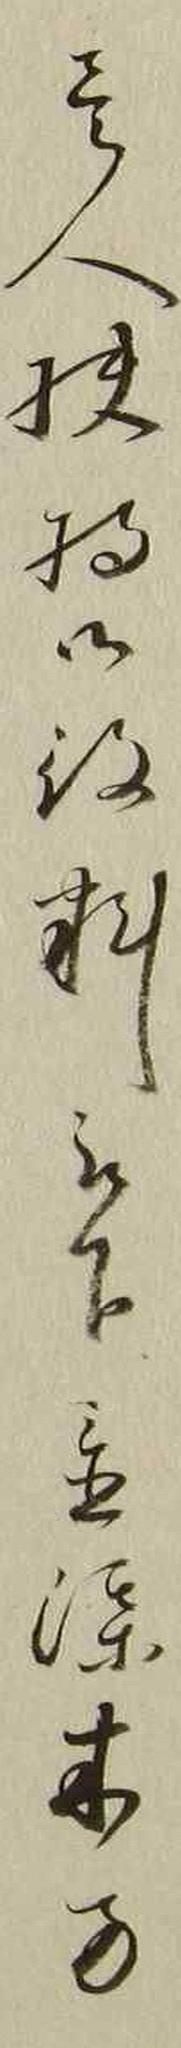壱人扶持御役料被下置漆木方
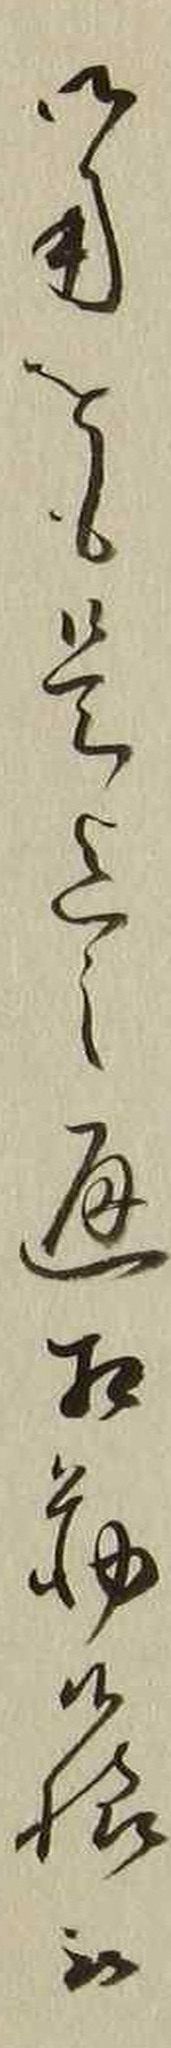御用をも是迄之通相勤候様被
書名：諸士系譜　巻之52　に之部3
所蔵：会津若松市立会津図書館
